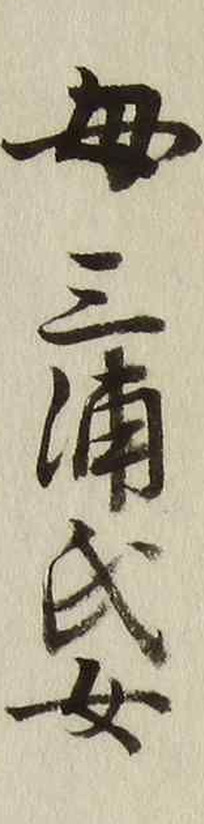母三浦氏女
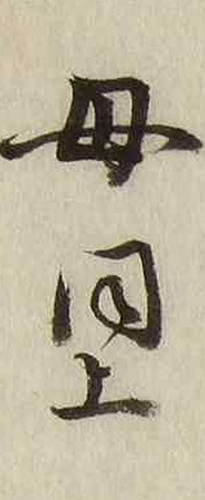母同上

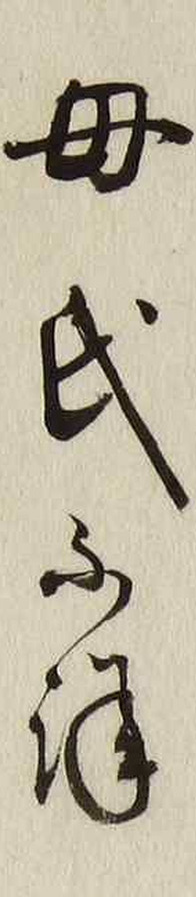母氏不詳
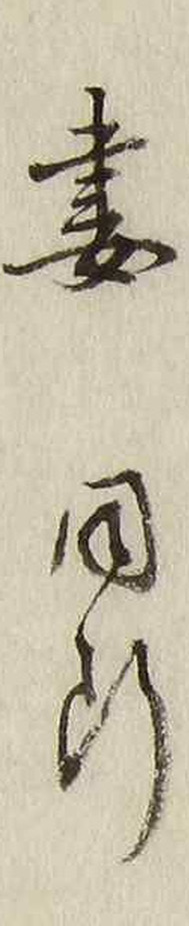妻同断

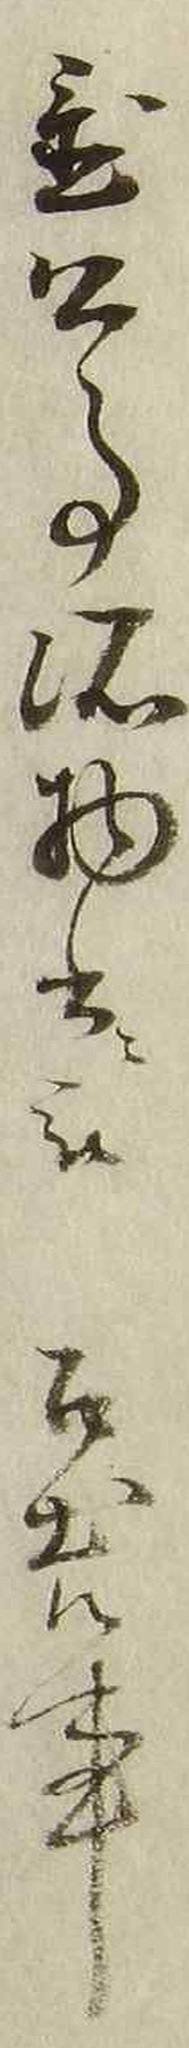置公事所物書ニ被召出侯事
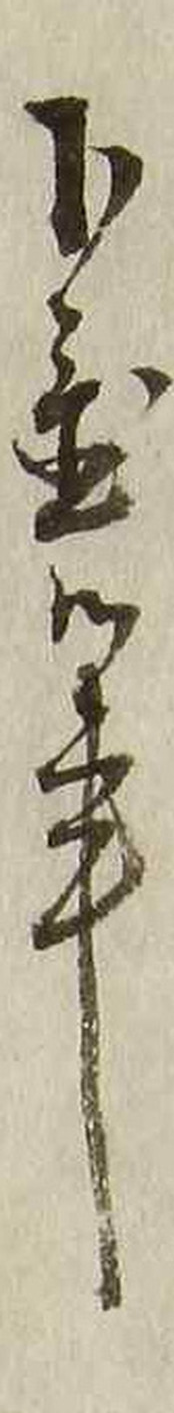下置候事
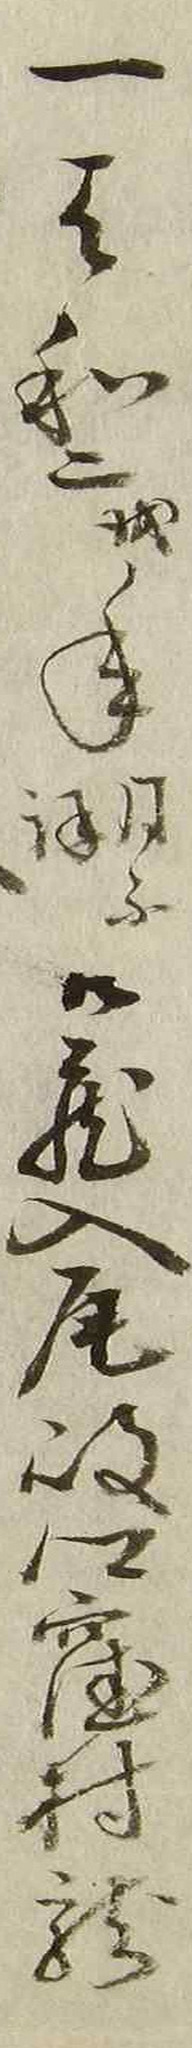一天和二戌年月不詳御蔵入尾岐郷窪村龍
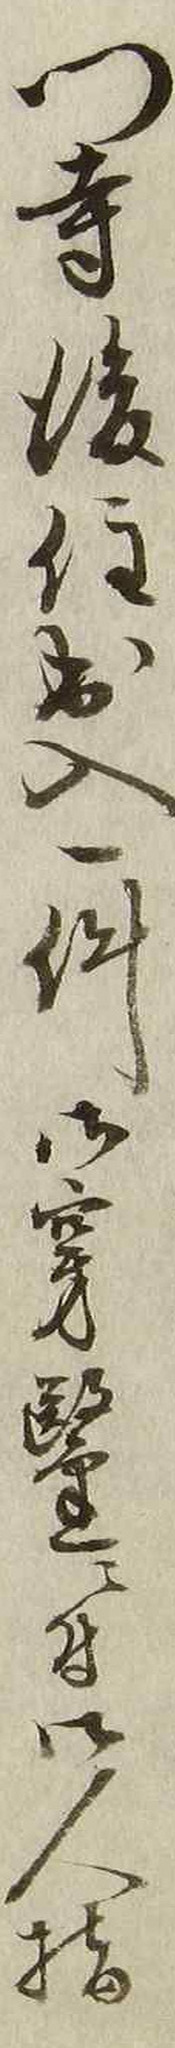門寺後住出入一件御穿鑿ニ付御人指
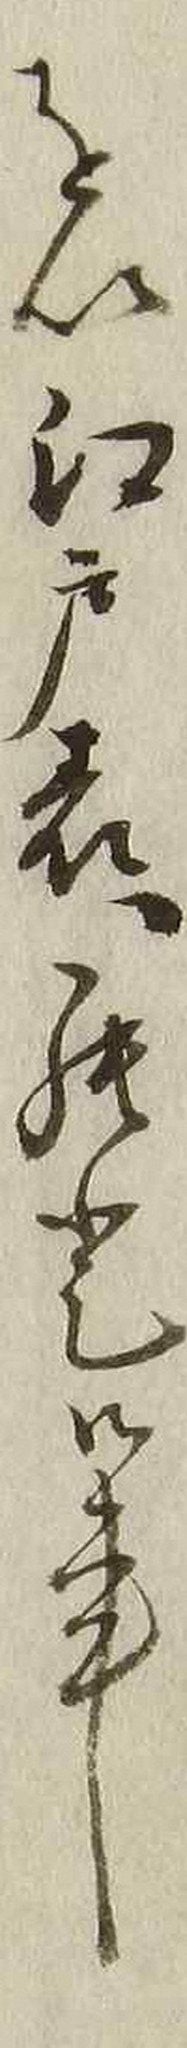を以江戸表へ罷登候事
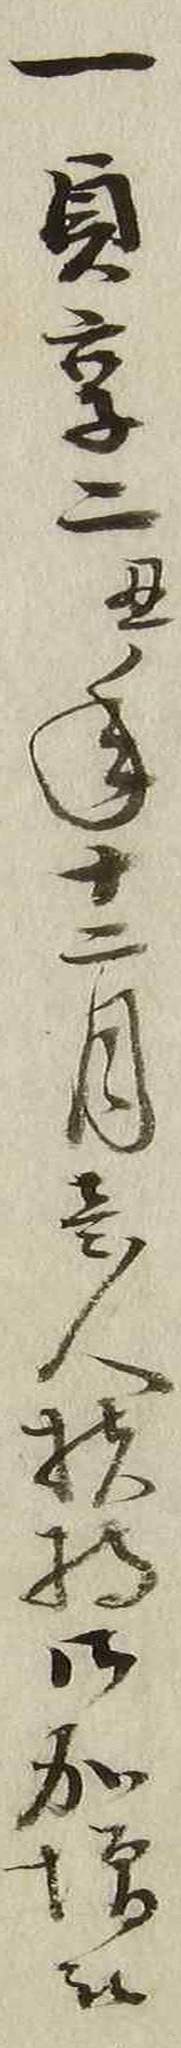一貞享二丑年十二月壱人扶持御加増被
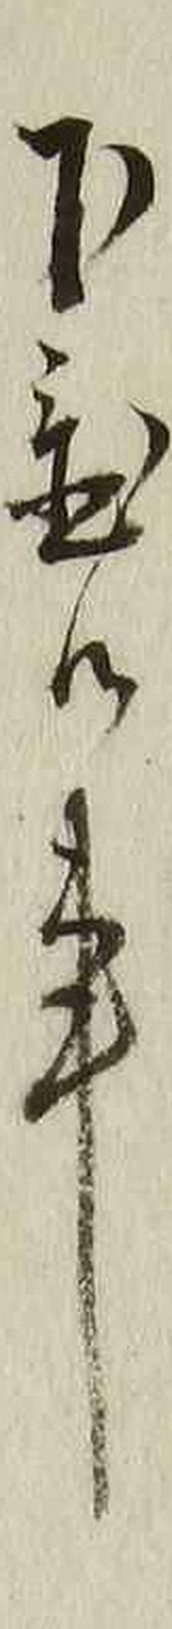下置候事
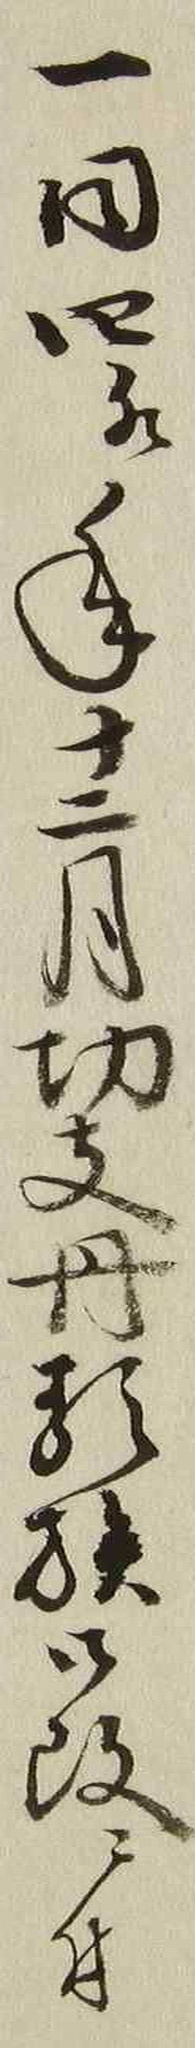一同四卯年十二月切支丹類族御改ニ付
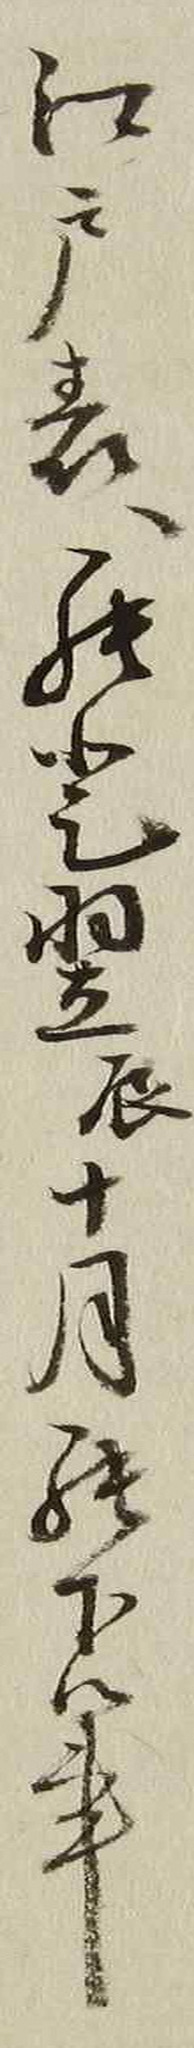江戸表へ罷登翌辰十月罷下候事
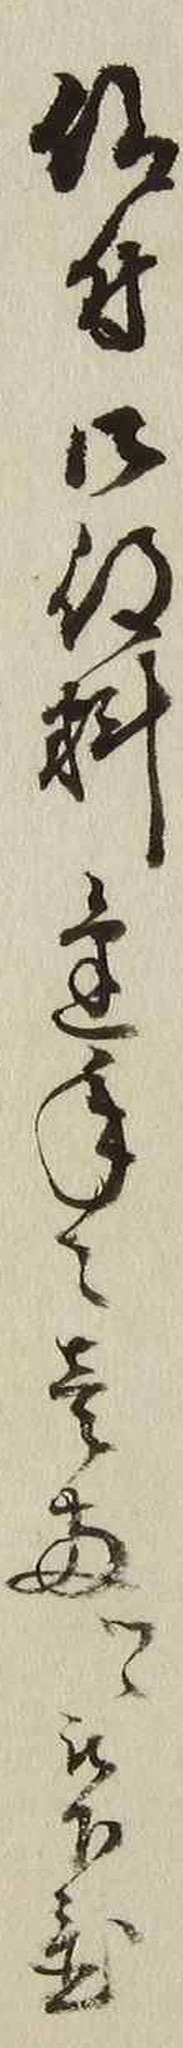仰付御役料金年々壱両ツヽ被下置
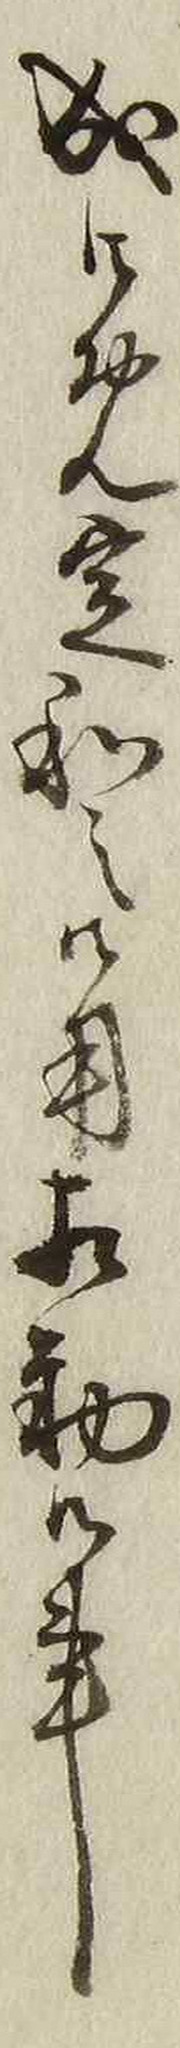成御免定和之御用相勤候事
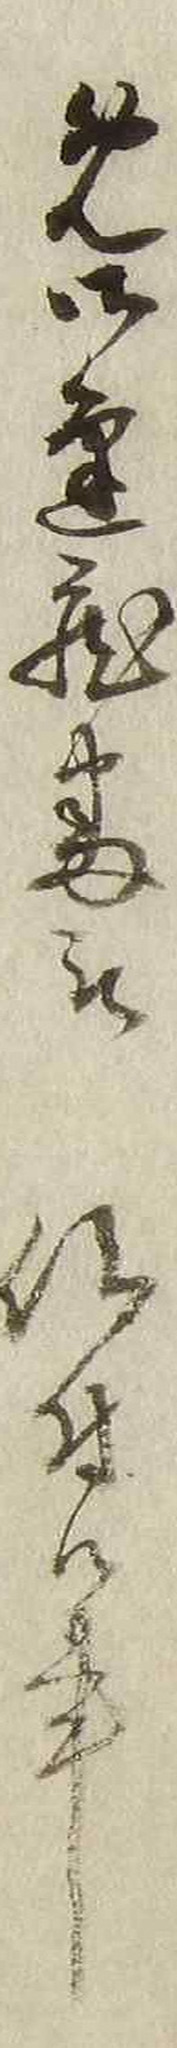免御金蔵番被仰付候事
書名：諸士系譜　巻之39　は之部7
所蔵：会津若松市立会津図書館
